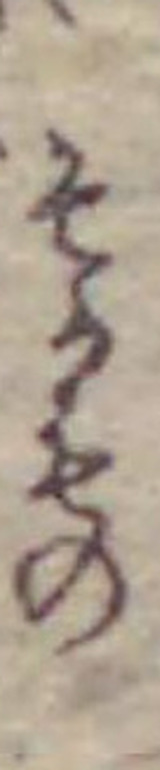そかもの
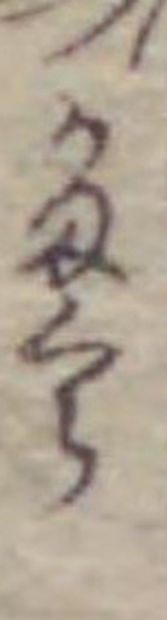かまくら
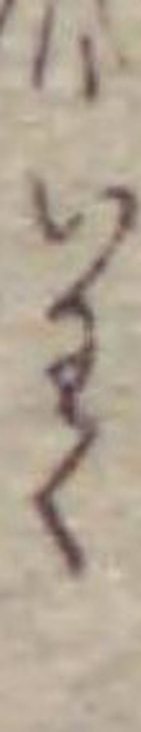いわく
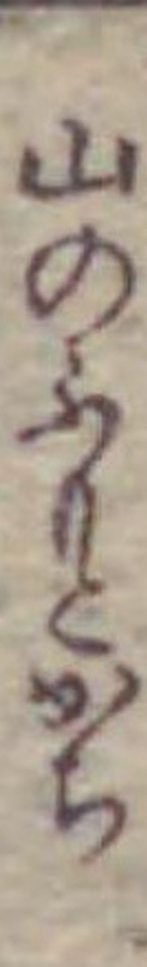山のふもとかち
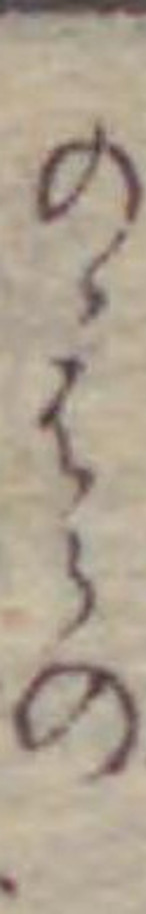のゝはらの
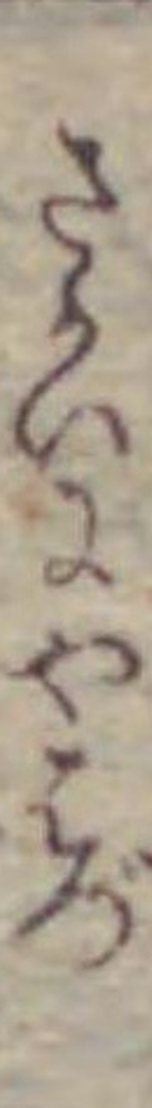さかいにやはづ
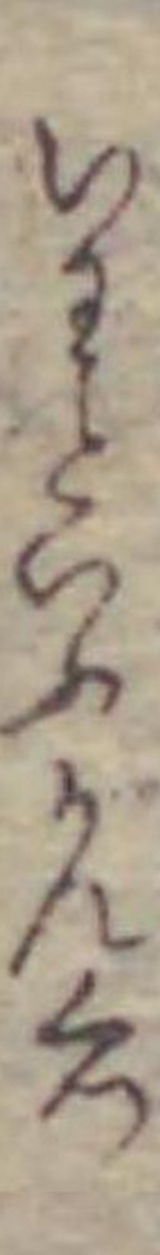いわといふがんくつ
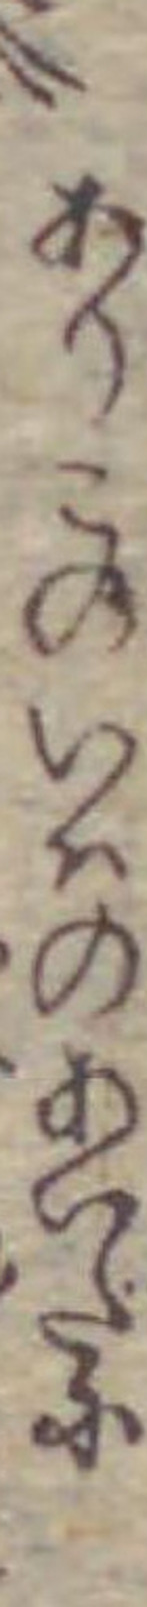ありこのいはのあいだに
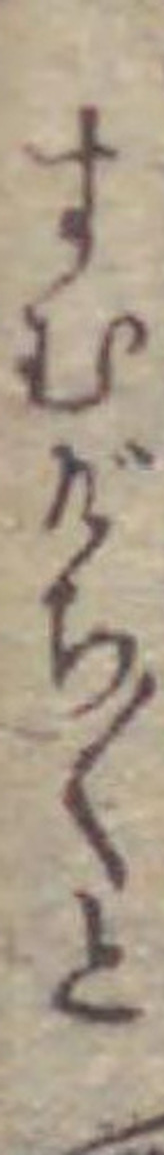すむげち〳〵と
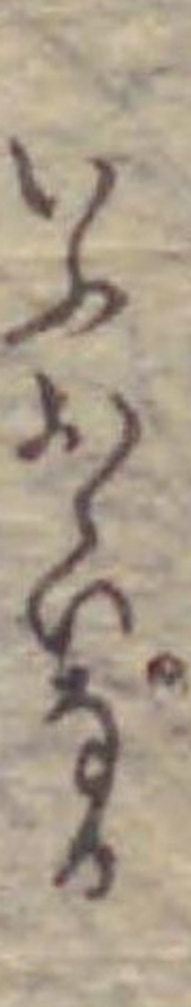いふおゝいなる
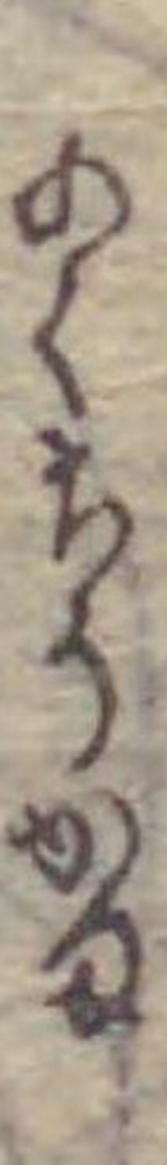あくちうかま
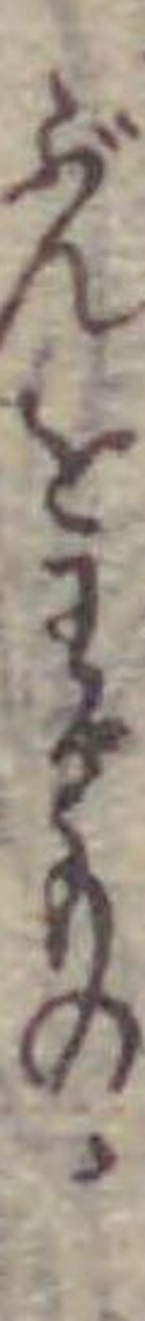ぶんをわがものゝ
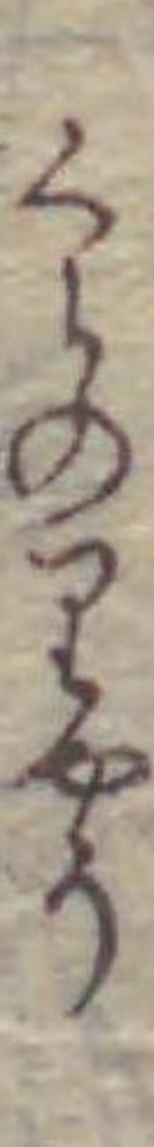くらのりやう
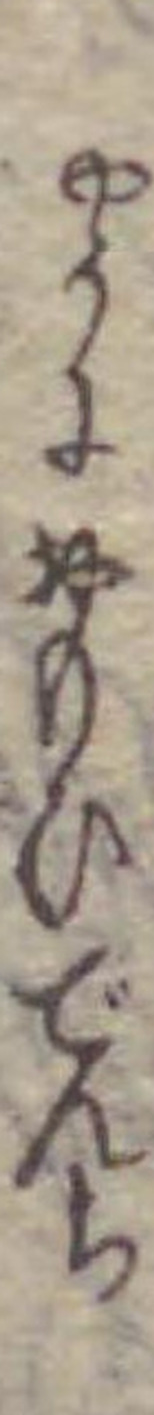やうにおもひでんち
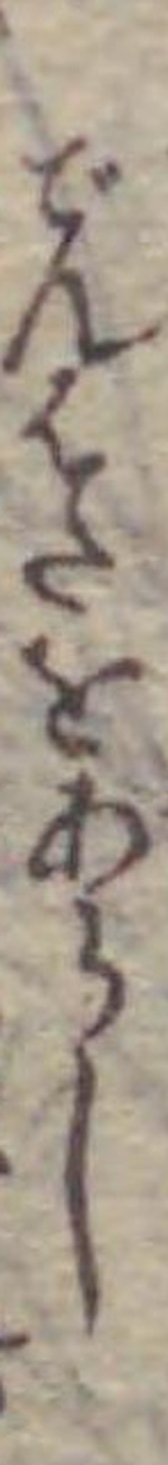でんはたをあらし
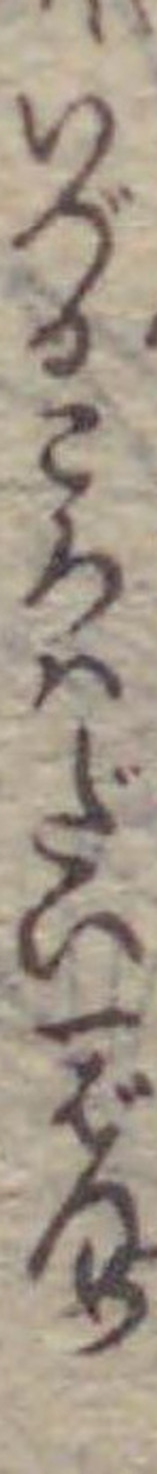いづるころはだい一ばんめ
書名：武家物奇談 : 3巻
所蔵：国立国会図書館 National Diet Library, JAPAN
